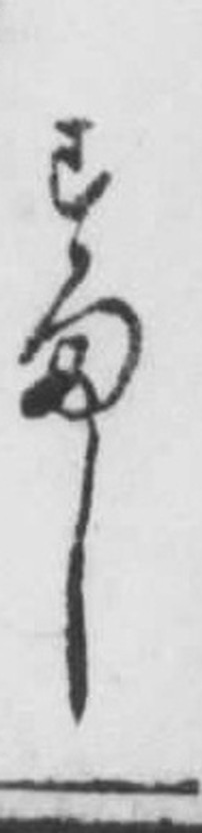すまし
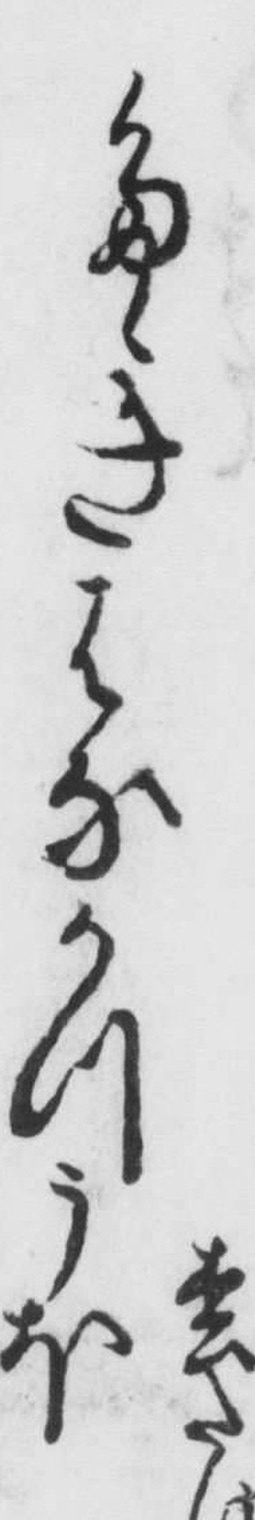きはなかつうを
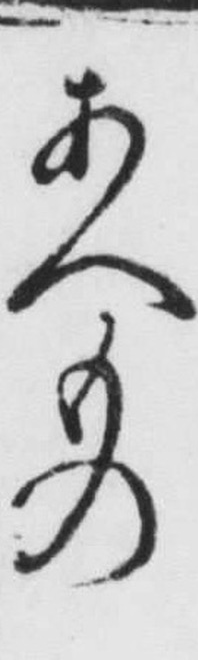あへもの
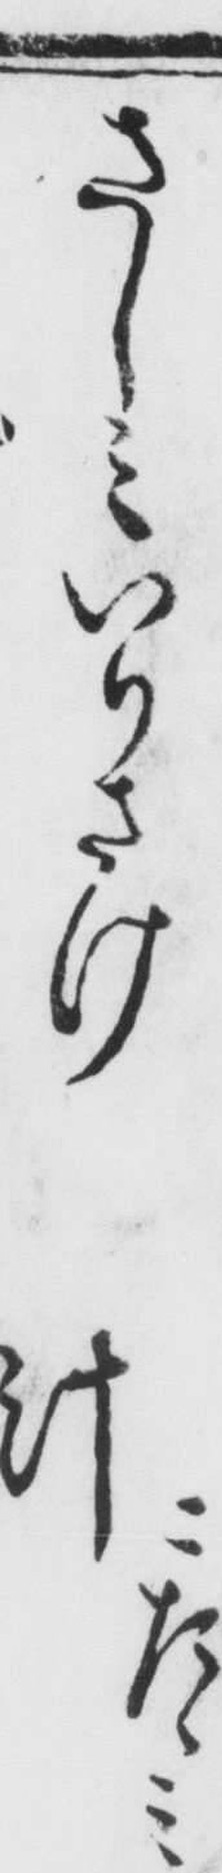さしミいりさけ汁
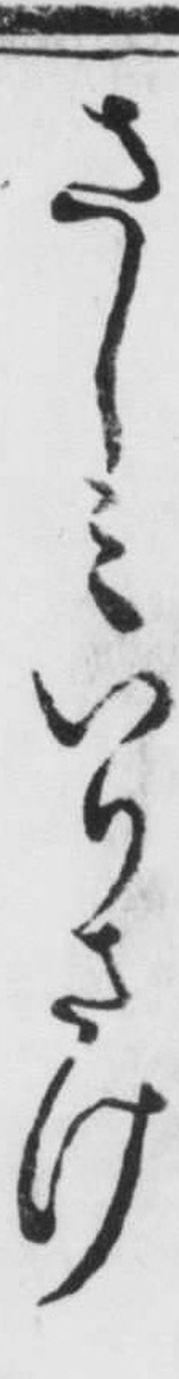さしミいりさけ汁
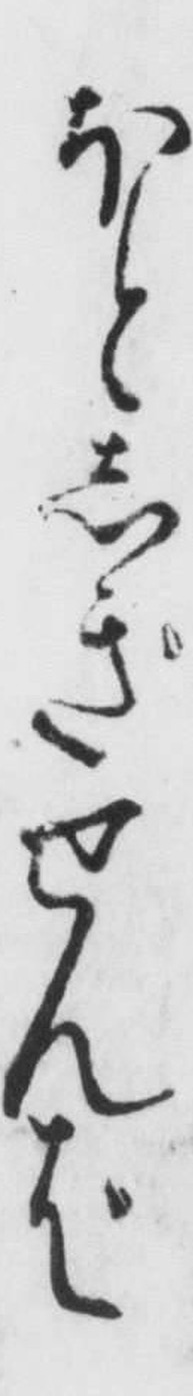ぼとしぎせんば
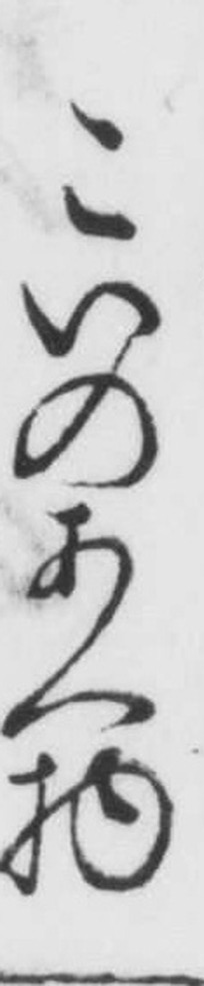こいのあへ物
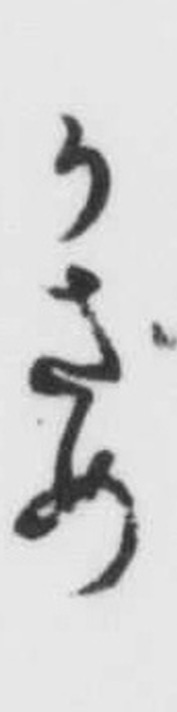かため
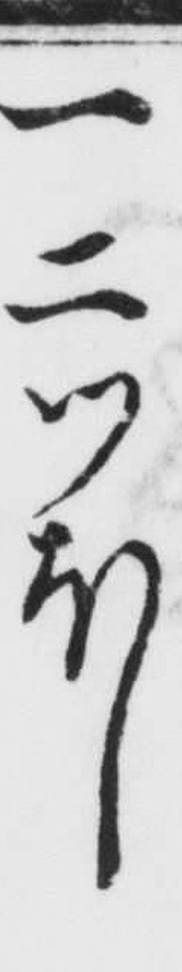一二ツぼし
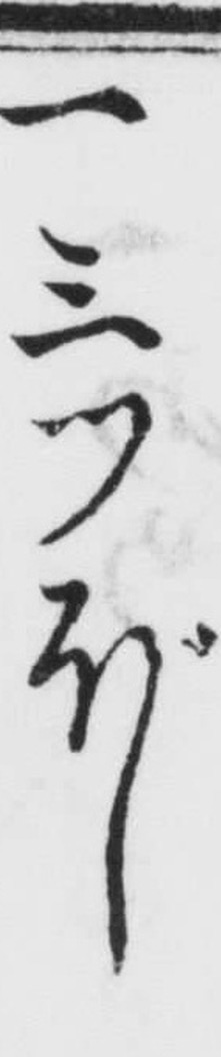一三ツぼし
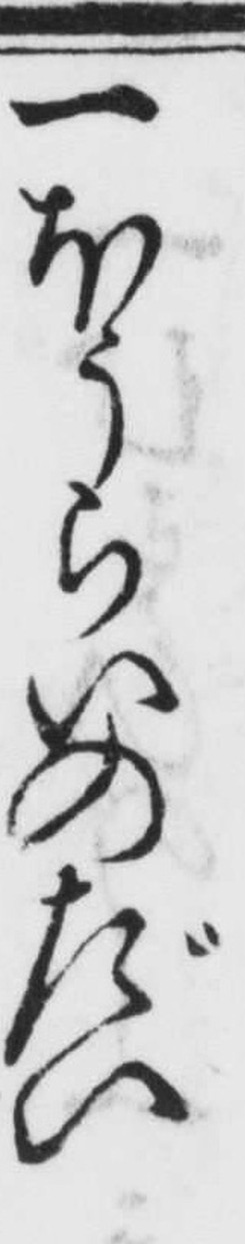一ほうらいのだい
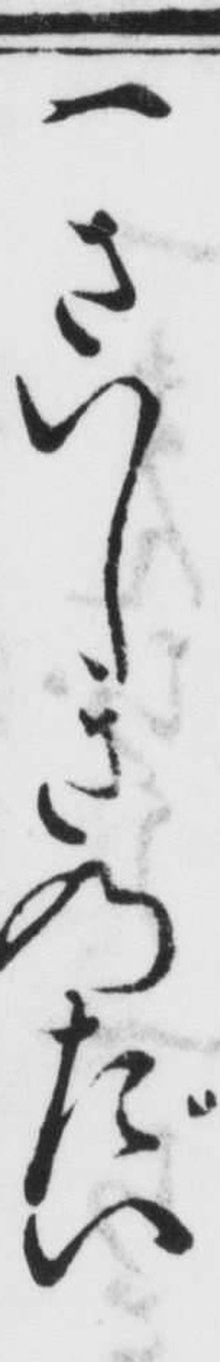一さいしきのだい

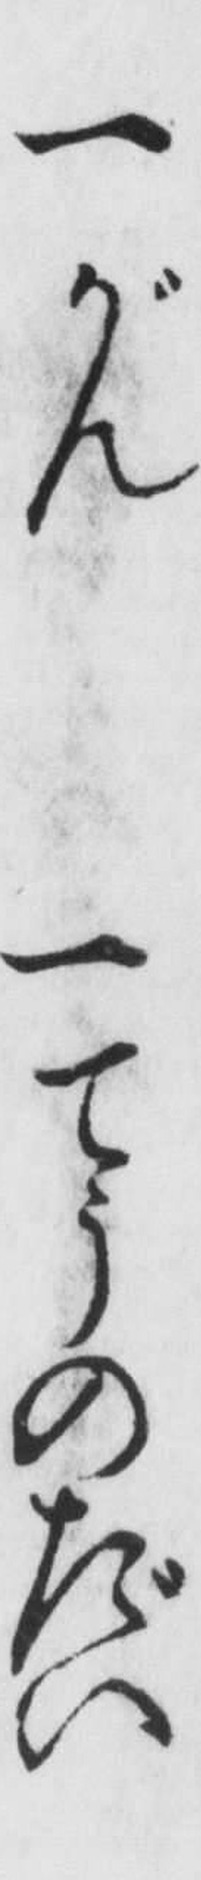一がん一てうのだい
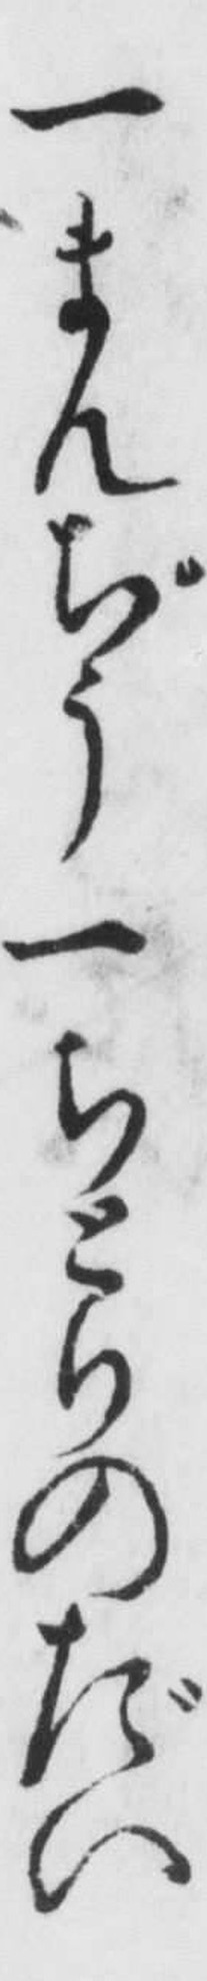一まんぢう一ちとりのだい
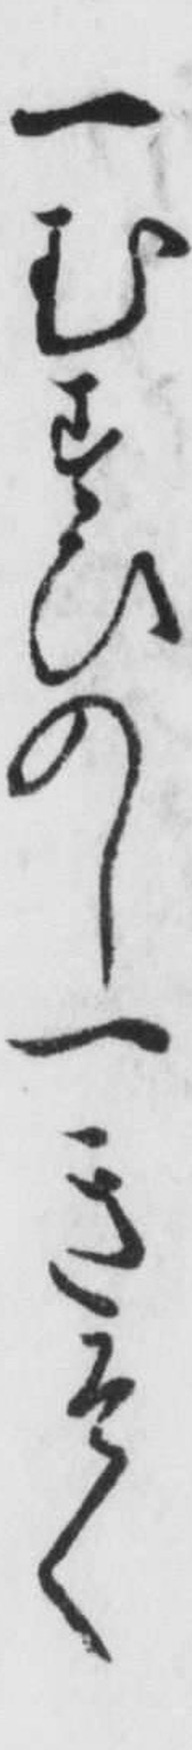一むすひのし一きそく
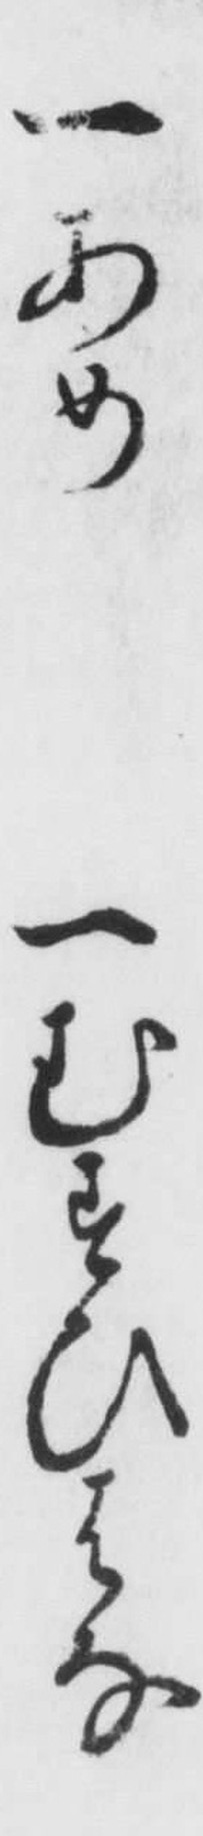一あめ一むすひはな
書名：料理切形秘伝抄
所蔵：大阪府立大学学術情報センター 国文学研究資料館
